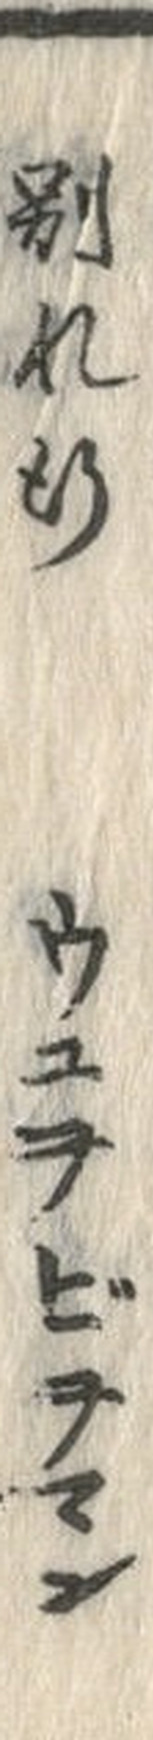別れ行ウユヲビヲマン

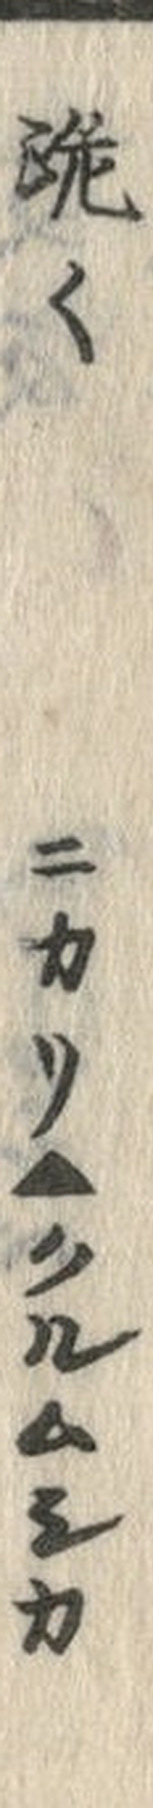跪くニカリ▲クルムシカ
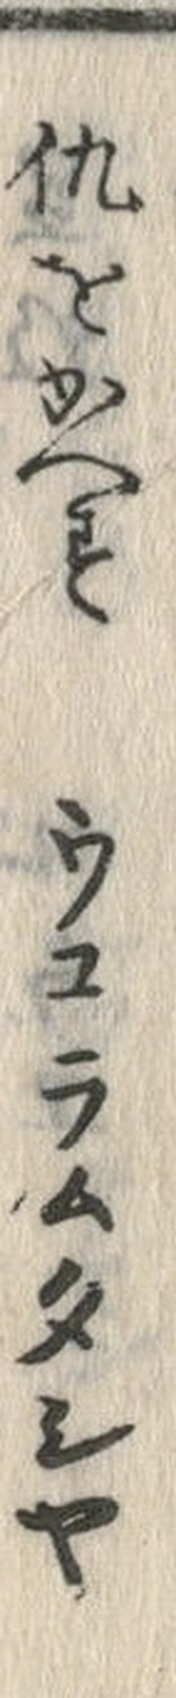仇をかへすウユラムタシヤ
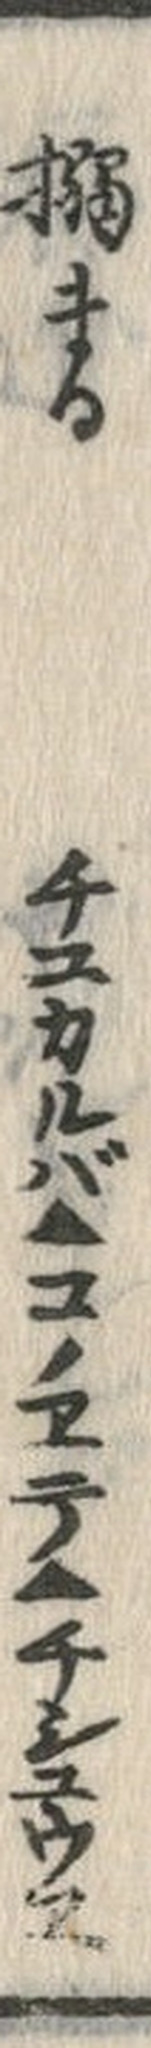搦まるチユカルバ▲コノヱテ▲チシユウヱ
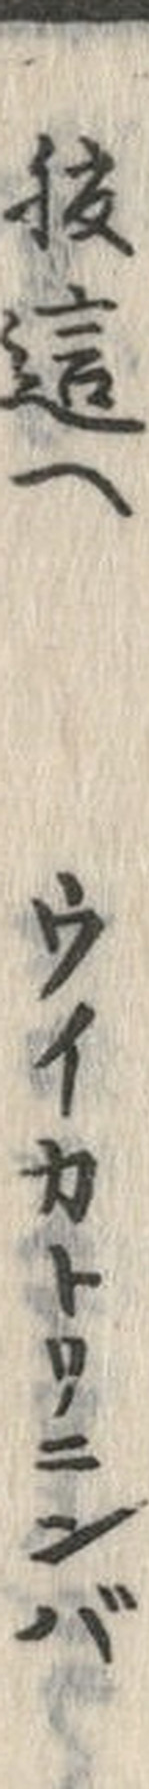腹這ヘウイカトリニンバ

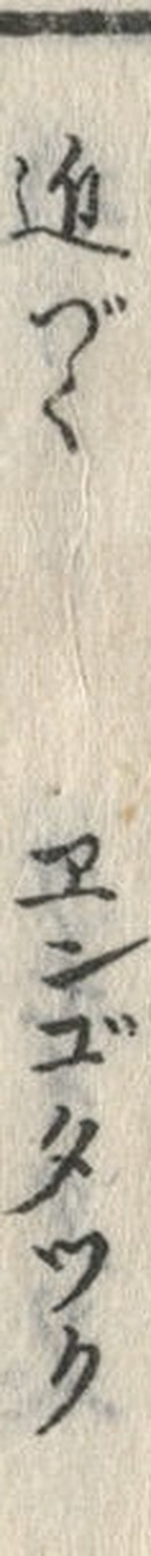近づくヱンゴタツク
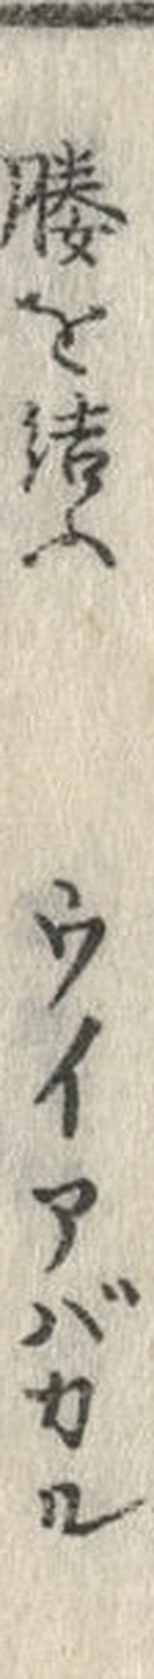媵？を結ふウイアバカル
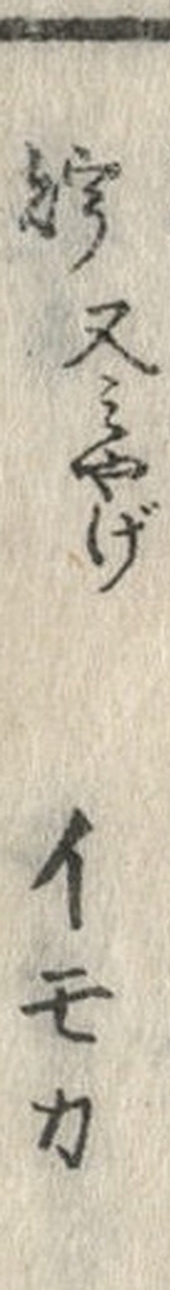貯又みやげイモカ

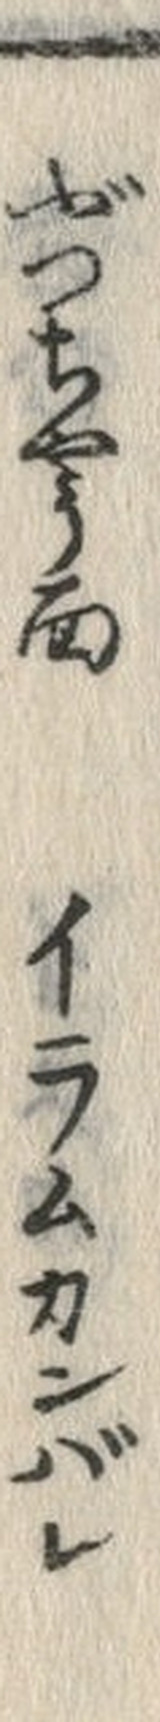ぶつちやう面イラムカンバレ

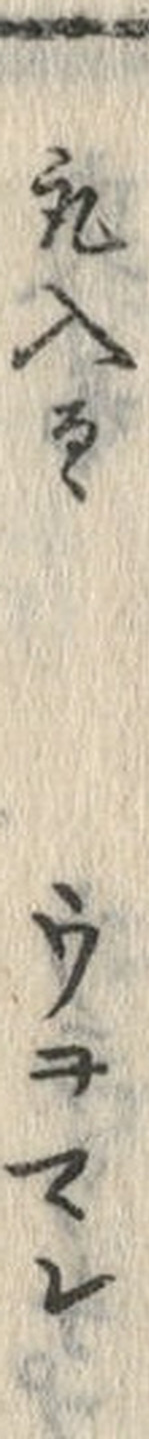取入るヽウヲマレ
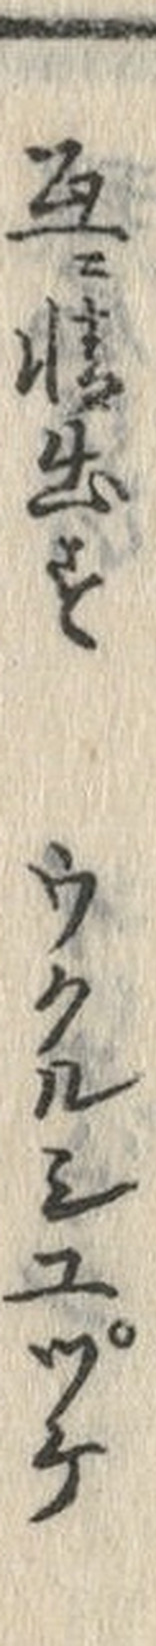互に精出すウクルシユツ゚ケ
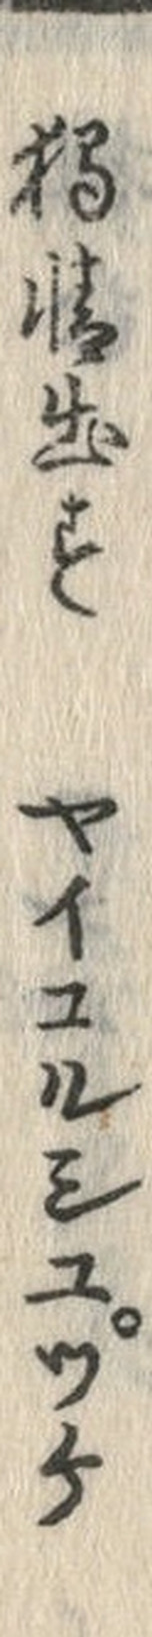独精出すヤイコルシユツ゚ケ
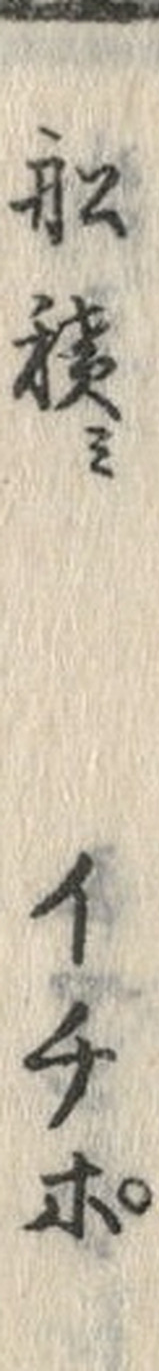船積みイチポ
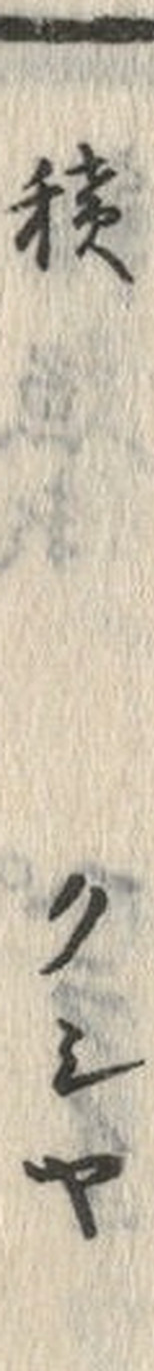積クシヤ
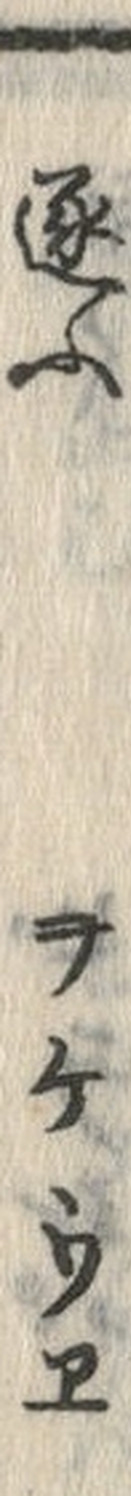逐ふヲケウエ
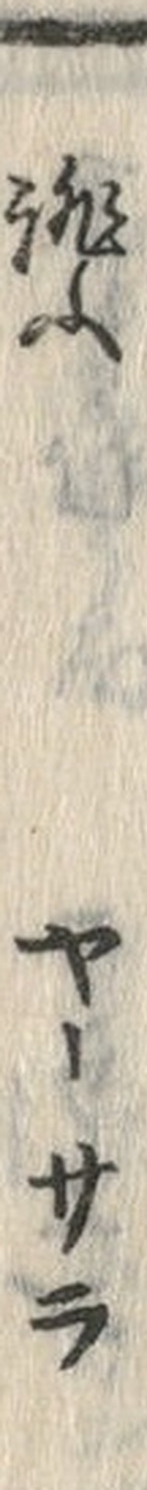誂ふヤーサラ
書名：蝦夷方言藻汐草　乾巻
